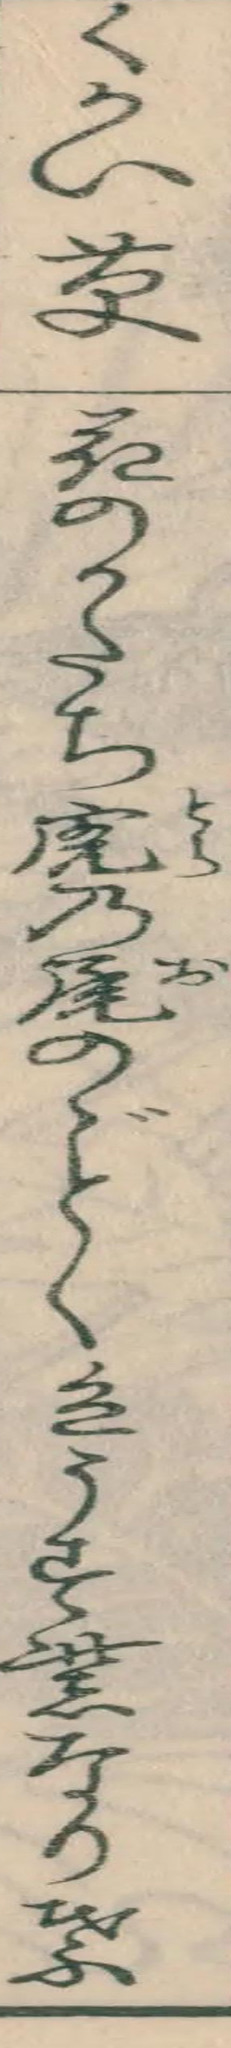[くかい草]花のかたち虎の尾のごとく色うす紫なり葉
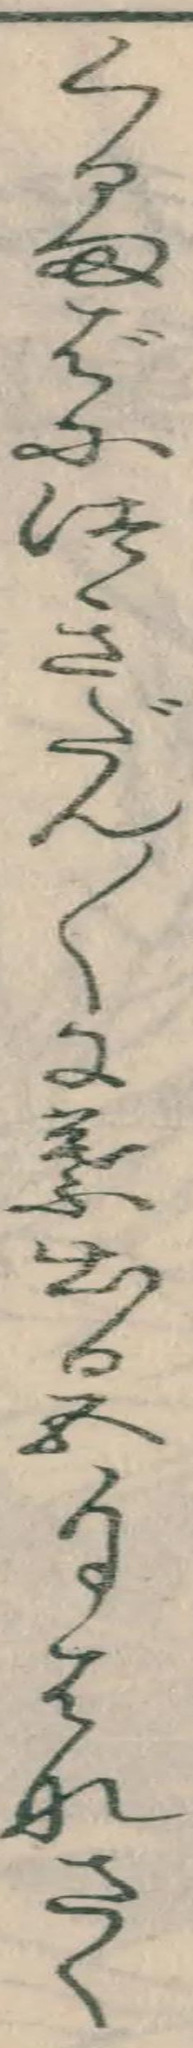くるまばにつきだん〳〵に葉出る五月はなさく
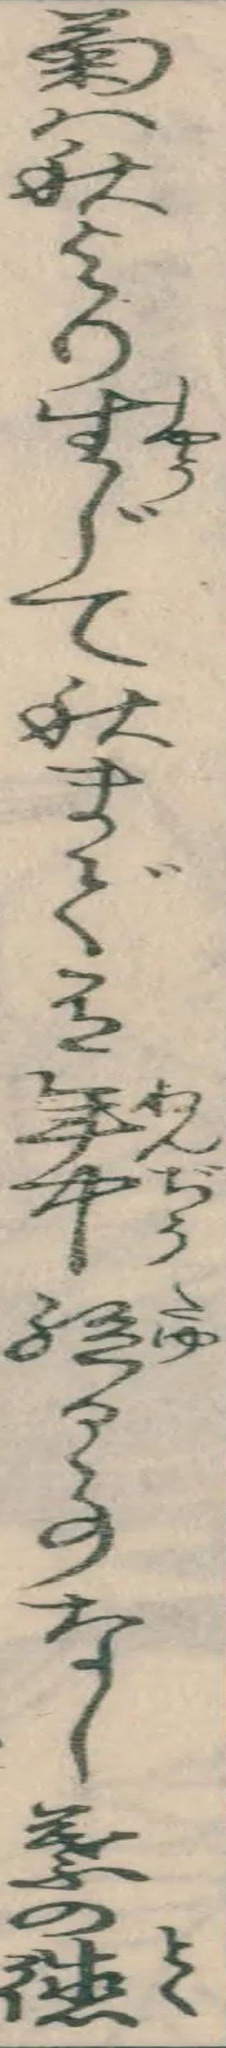菊は秋より生じて秋まで有年中絶る事なし葉の徳
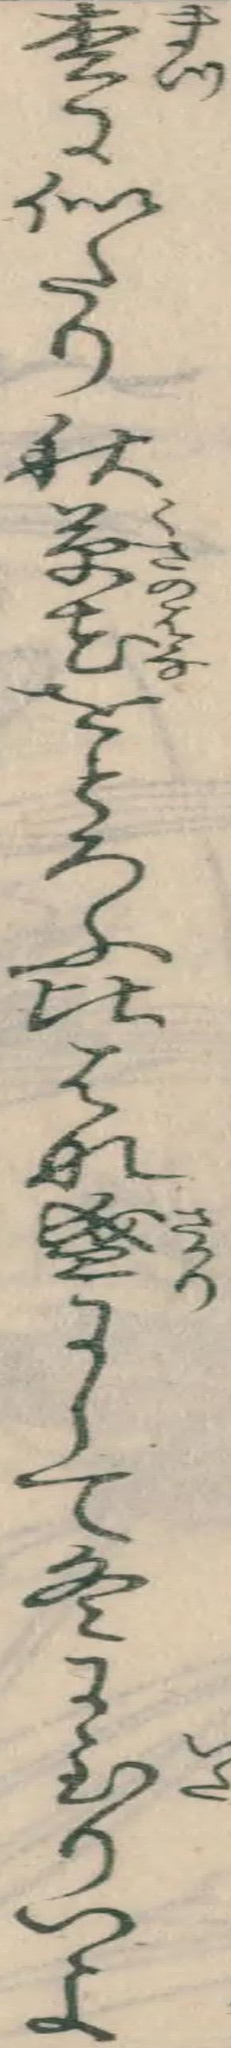松に似たり秋草花をとろふ比はな盛にして冬に至りいよ
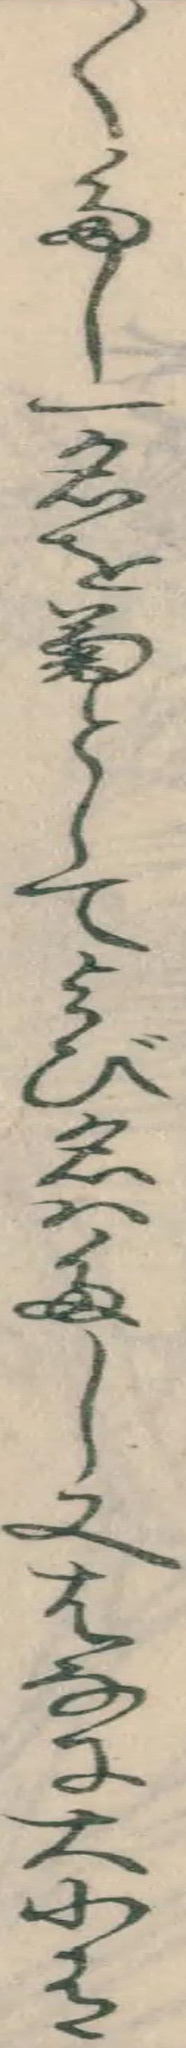〳〵多し一名を菊としてよび名は多し又はなに大小有
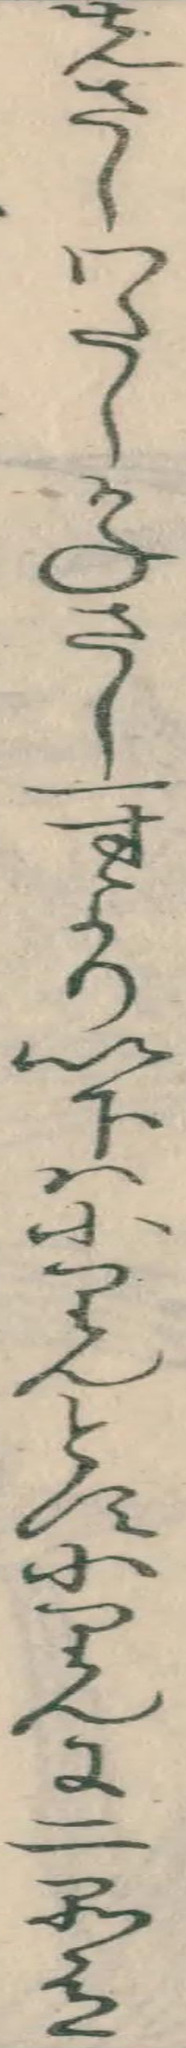先さしわたしかねさし一寸より以下は小りんとす小りんに二品有
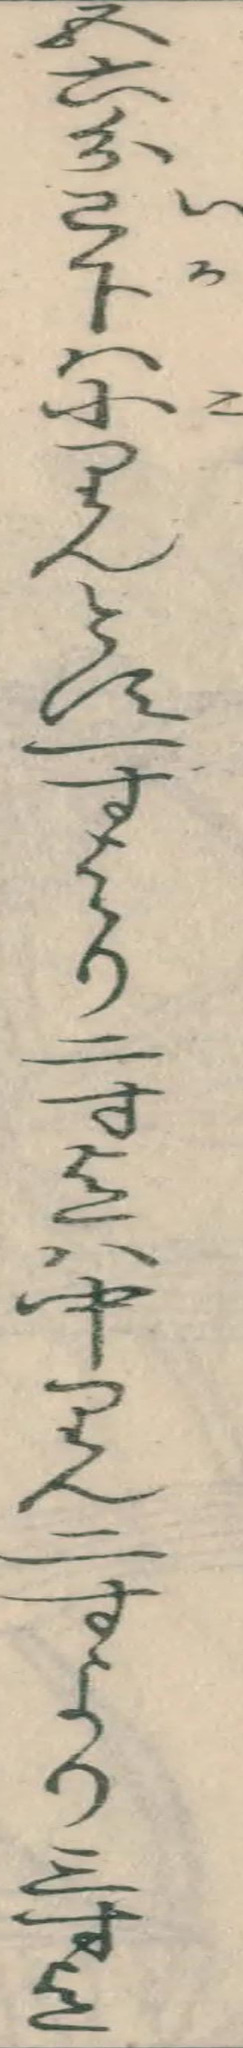五六分已下は小りんとす一寸より二寸迄は中りん二寸より三寸迄
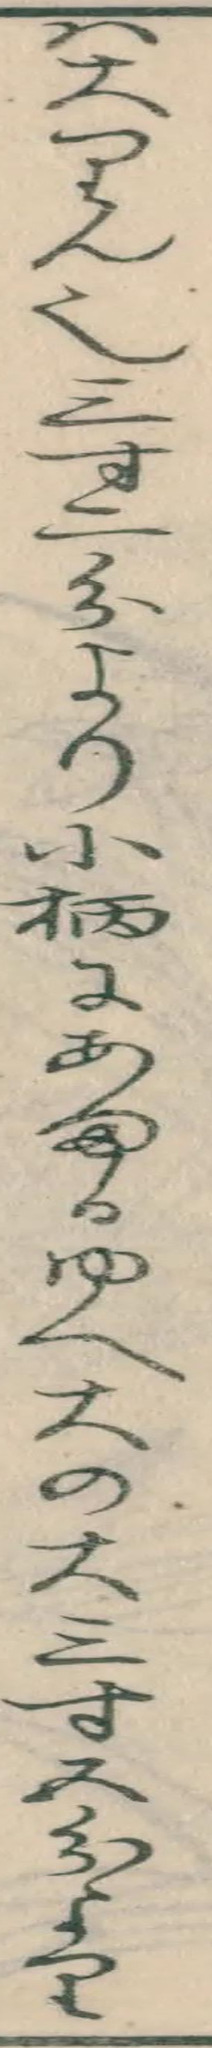は大りん也三寸二分より小柄にあたるゆへ大の大三寸五分より
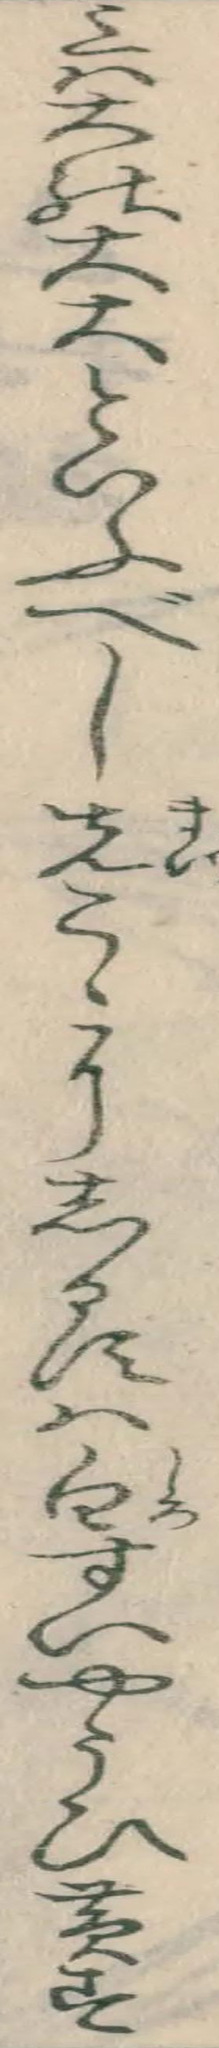上は大の大大といふべし先こゝにしるすは白すいやうひ黄す
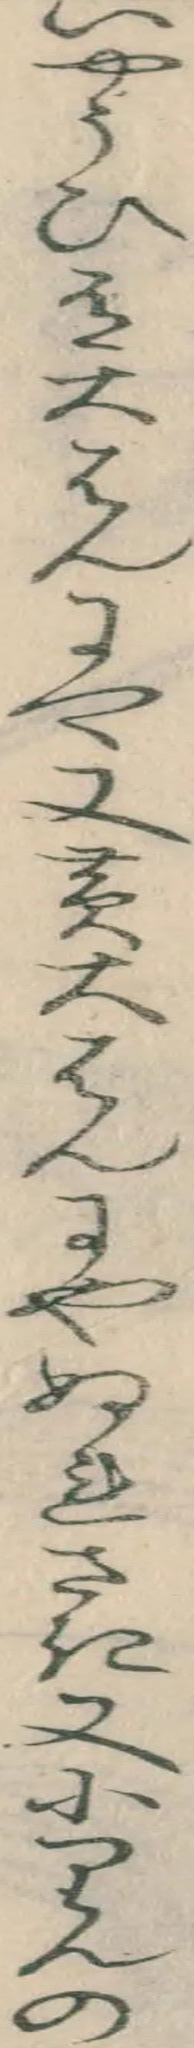いやうひ有大はんにや又黄大はんにやぬれさき又小りんの
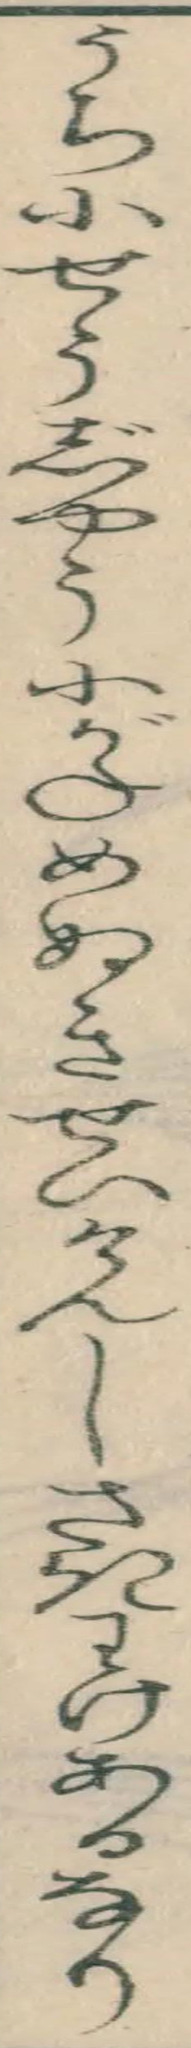うち小せうじやう小がねめぬきせいけんしさきわけあるなり

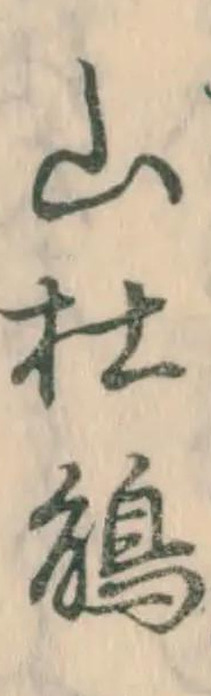山杜鵑
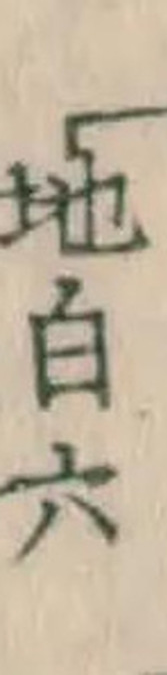地白六
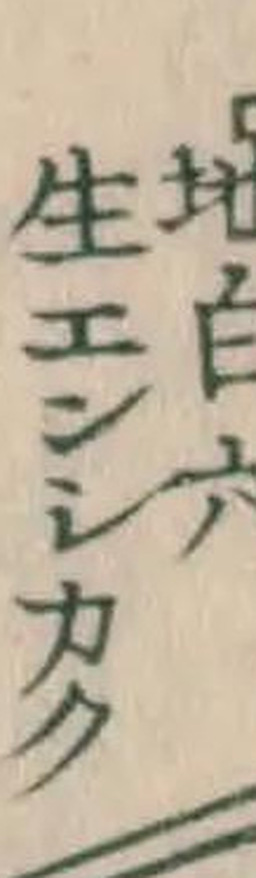生エンシカク
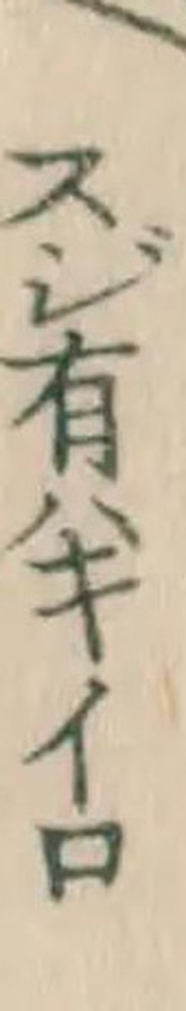スジ有ハキイロ
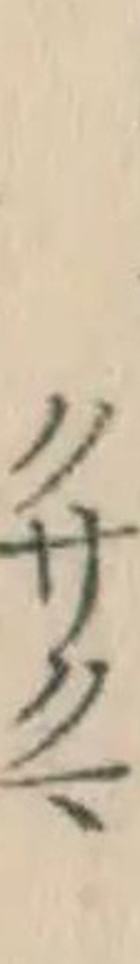クサクマ
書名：畫本野山草. [1]
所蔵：国立国会図書館 National Diet Library, JAPAN
